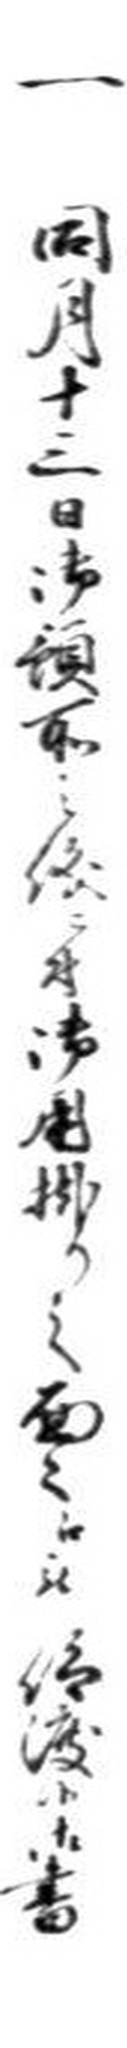一同月十三日御領所之儀ニ付御用掛り之面々江被仰渡候御書
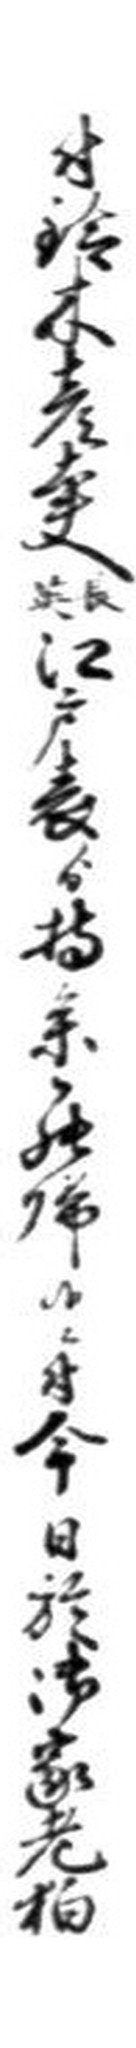付鈴木彦太夫長英江戸表ゟ持参罷帰候ニ付今日於御家老狛
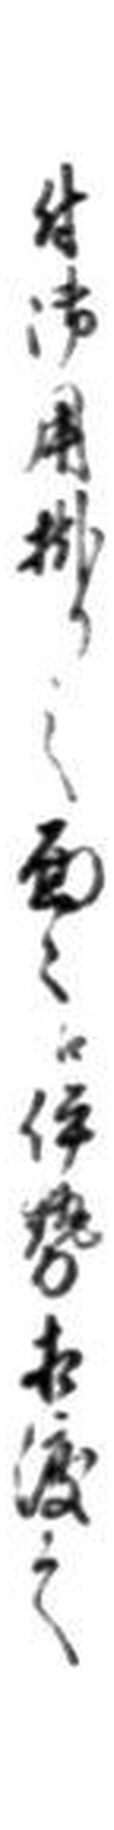付御用掛り之面々江伊勢相渡之
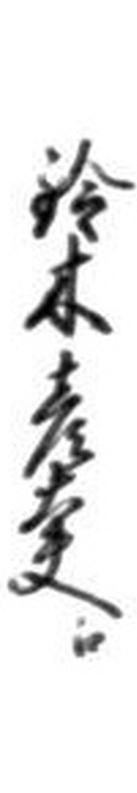鈴木彦太夫江
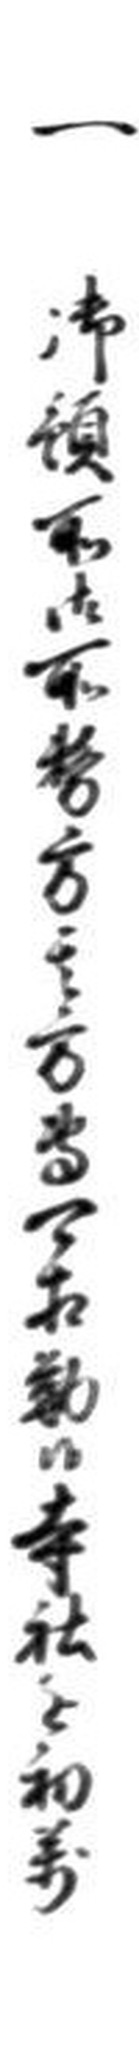一御領所御所務方其方専可相勤候寺社を初萬
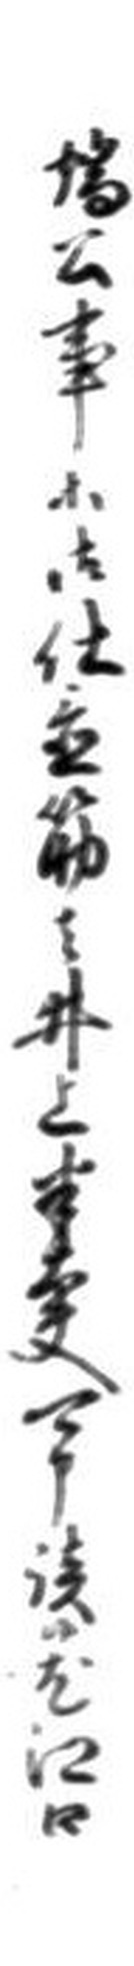端公事等御仕置筋者井上半太夫可申談候尤江口
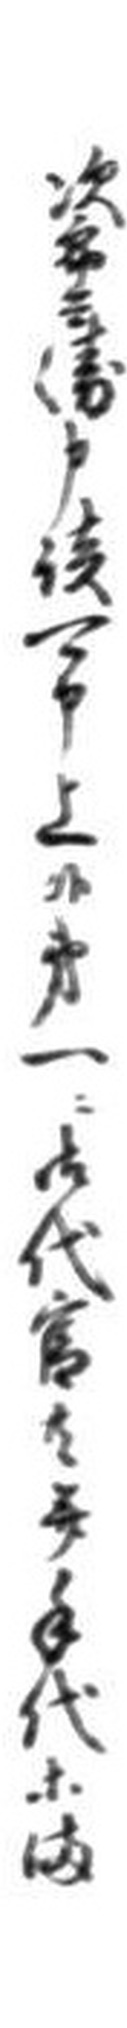次郎兵衛申談可申上候第一ニ御代官共手代等ま
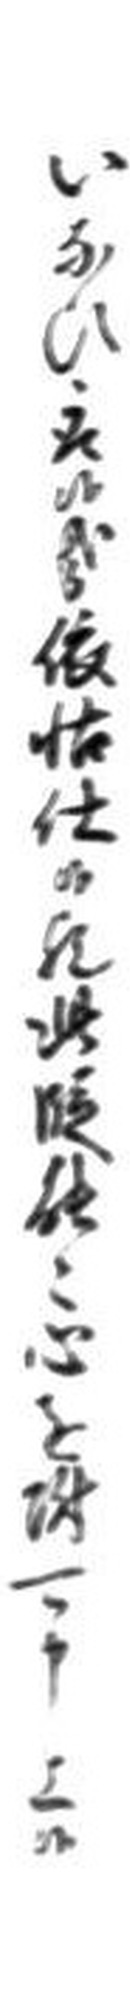いなひ取候哉依怙仕候歟此段能々心を付附可申上候
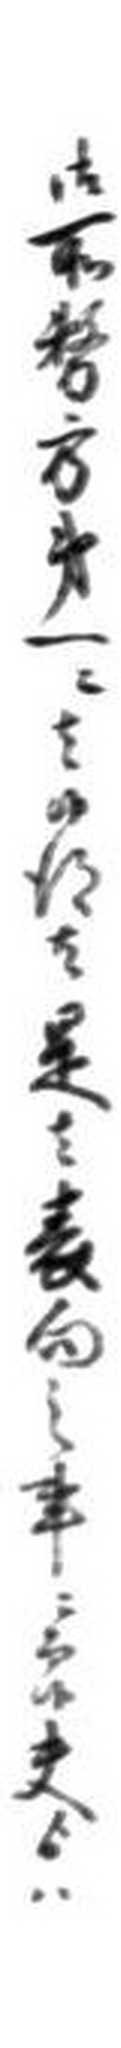御所務方第一ニ者候得共是者表向之事ニ而候夫ゟハ
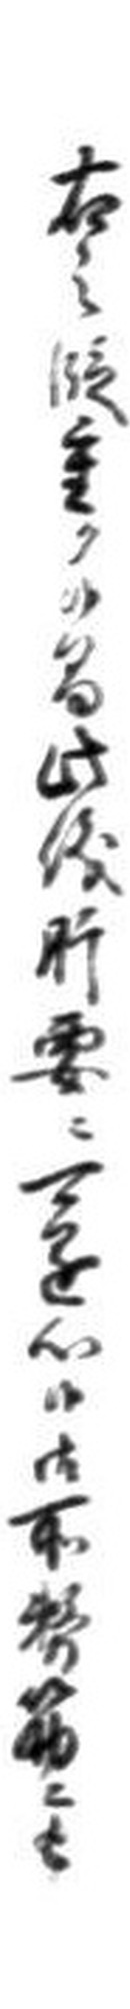右之段重ク候間此儀肝要ニ可遂心候御所務筋ニも
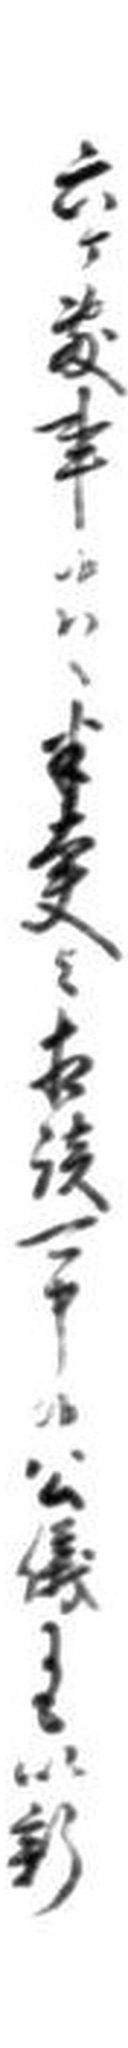六ケ敷事候ハヽ半太夫与相談可申候公儀にも以新

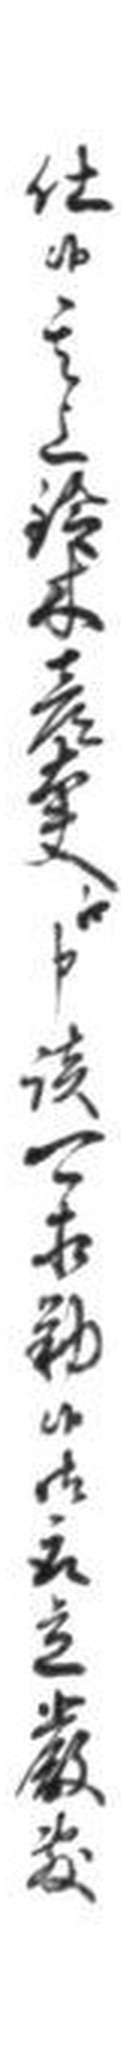仕候其上鈴木彦太夫江申談可相勤候取立厳敷
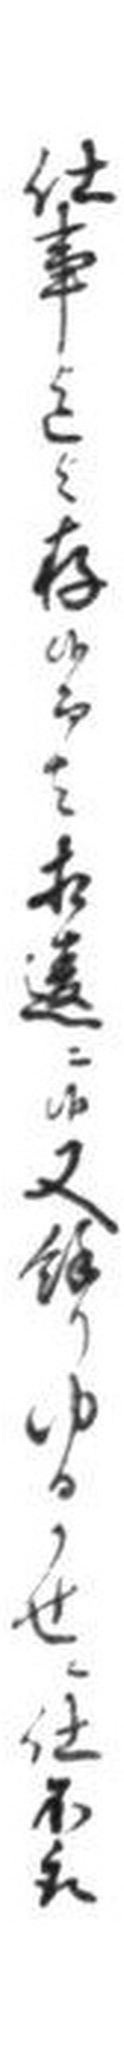仕事迄与存候而者相違ニ候又餘りゆるかせニ仕不取
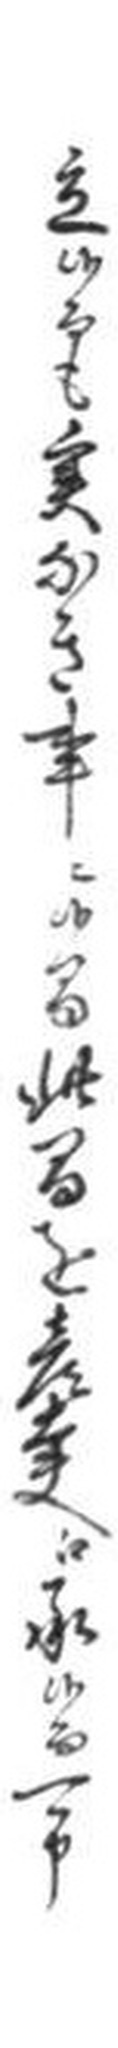立候而も実なき事にニ候間此間を彦太夫江承候而可申
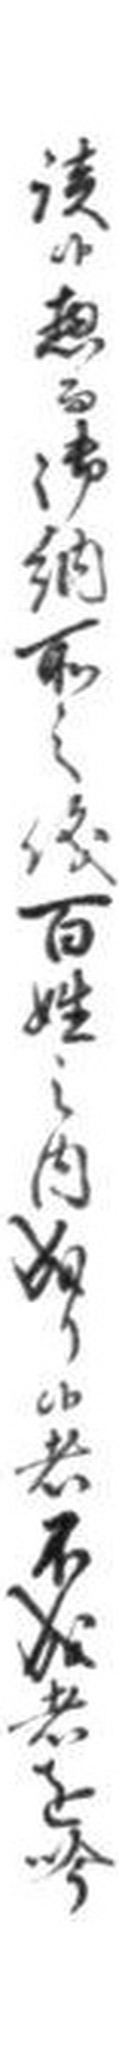談候惣而御納所之儀百姓之内成り候者不成者を吟
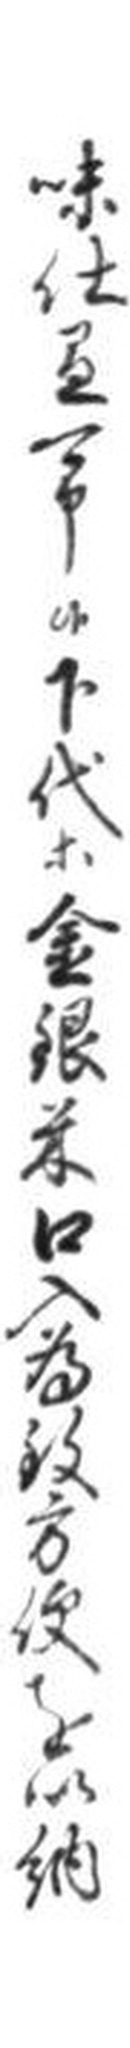味仕置可申候下代な等金銀米口入為致方便を以納
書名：家譜 三十四 吉邦公 従享保五年到同六年
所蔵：福井県文書館 Fukui Prefectural Archives
